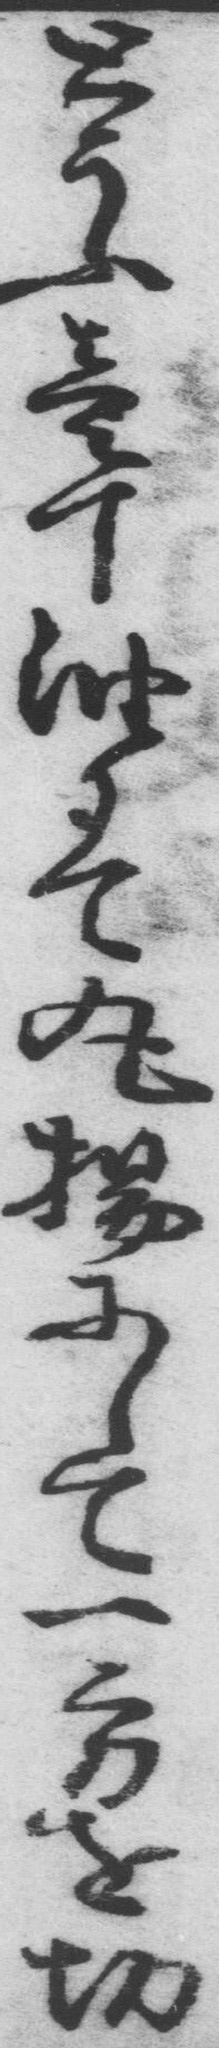とうふ壱丁油にて丸揚にして一方を切
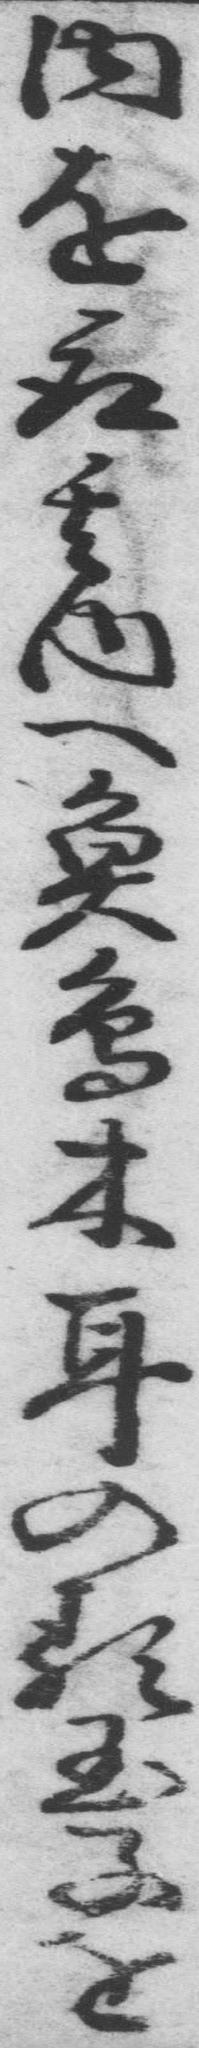内を取其内へ魚鳥木耳の類玉子を
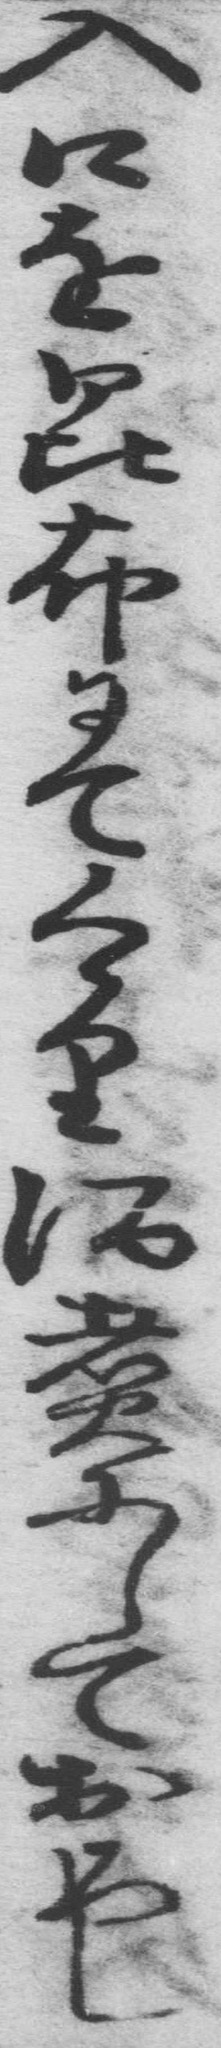入口を昆布にてくゝり酒煮にしておろし
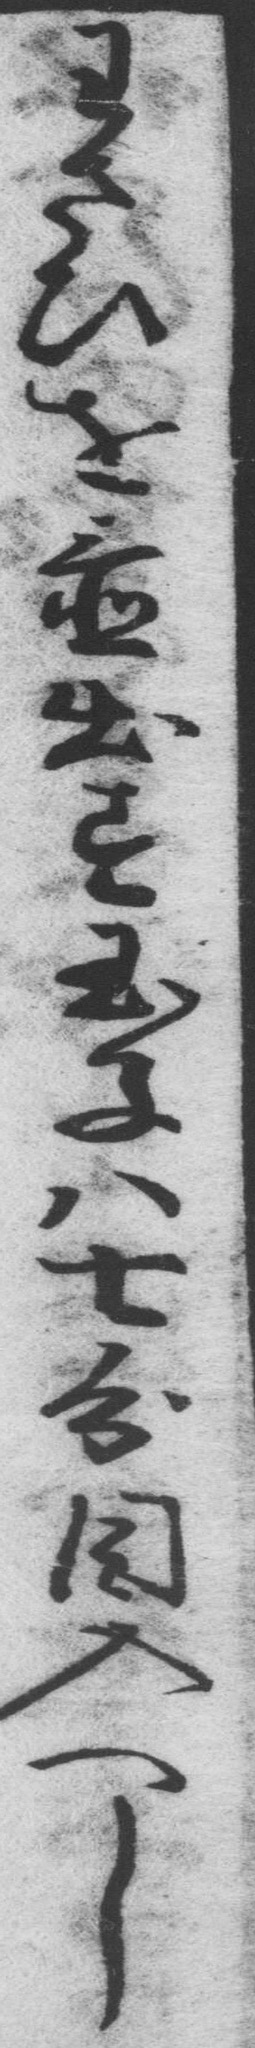わさひを置出す玉子は七分目入へし
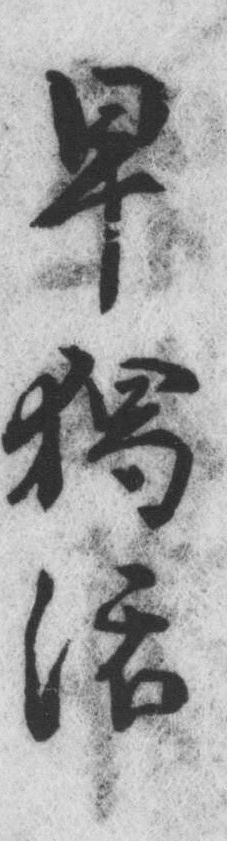早独活
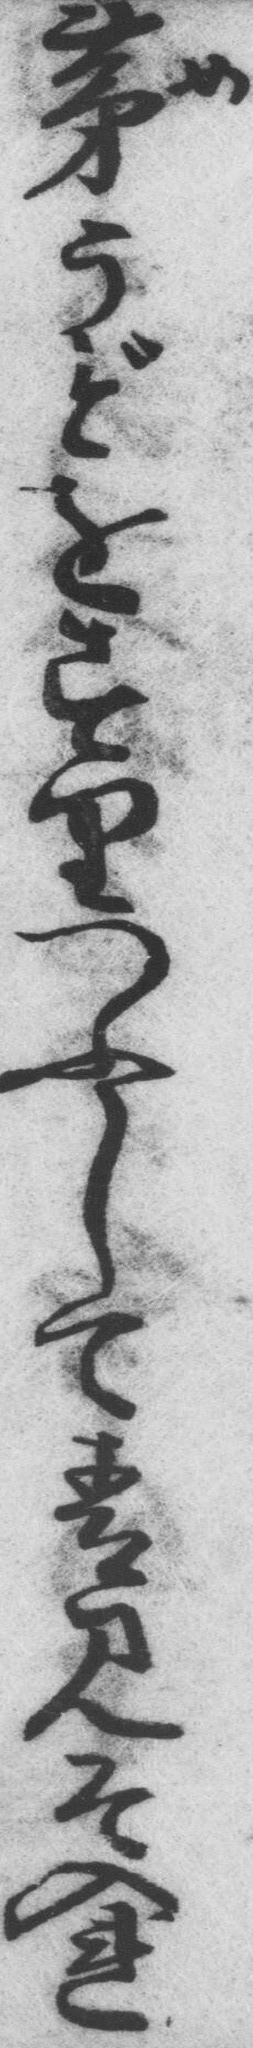芽うどをすりつふして麦みそ入れ
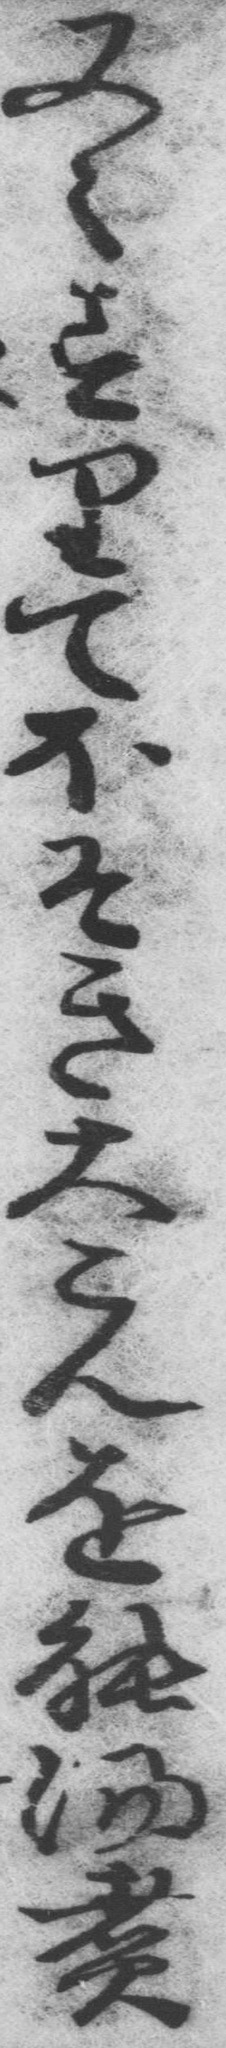又々すりてほそき大こんを能湯煮
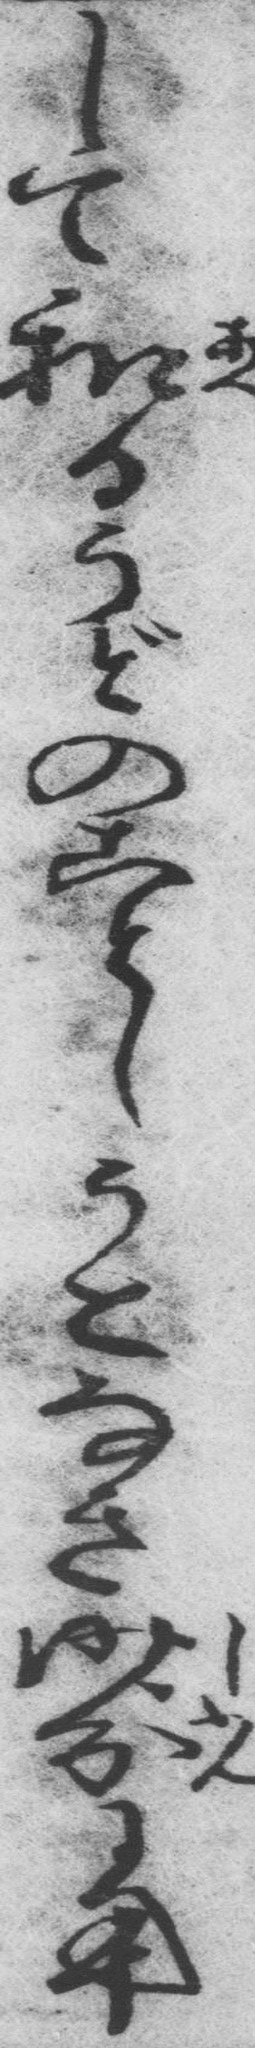して和るうどのことしうとなき時分に用
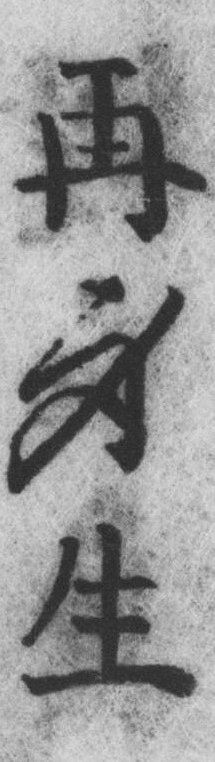再身生
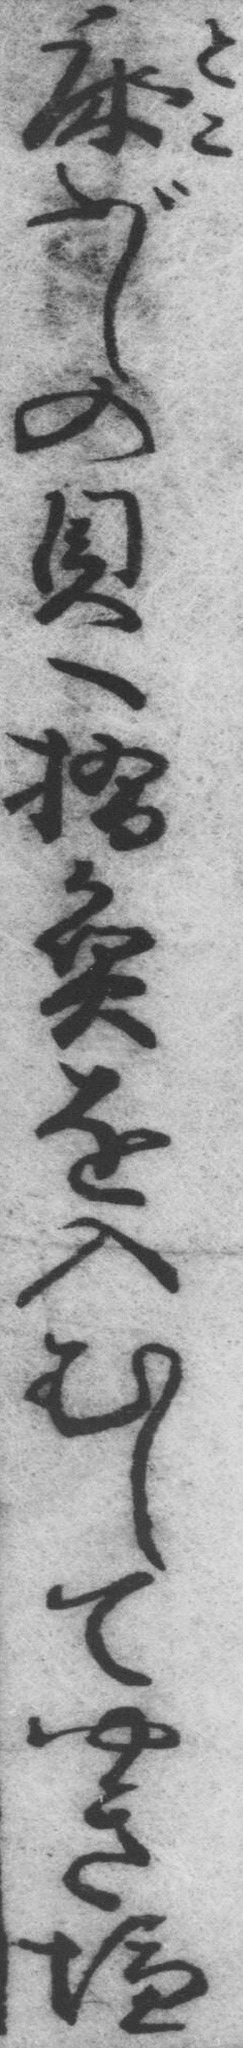床ぶしの貝へ摺魚を入むしてやき塩

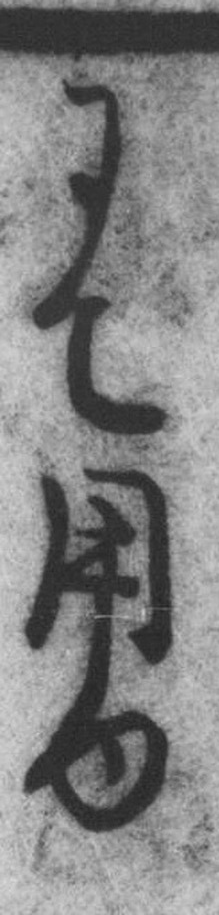にて用ゆ
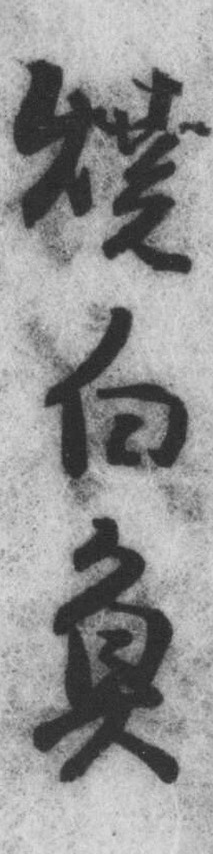焼白魚
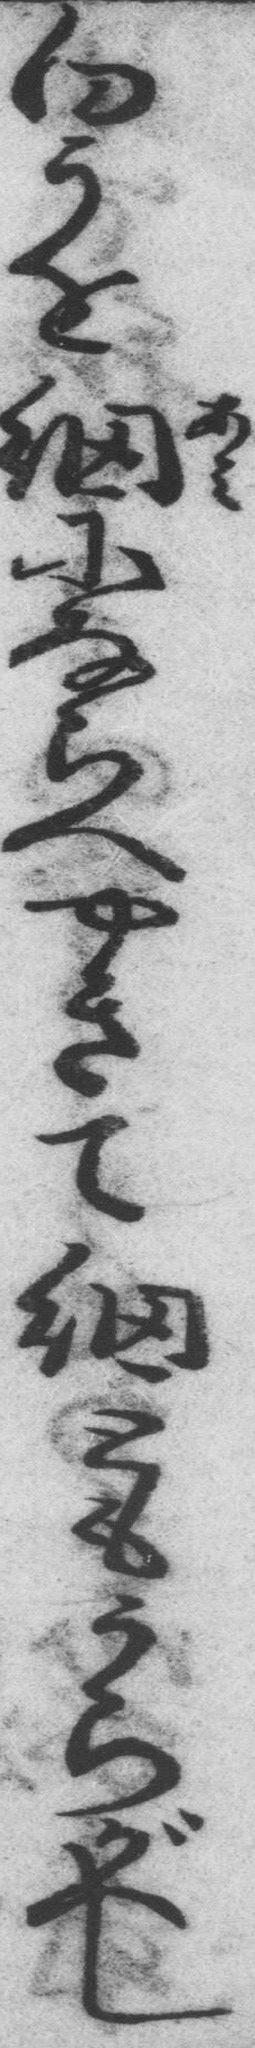白うを網にならへやきて網ともうらがへし
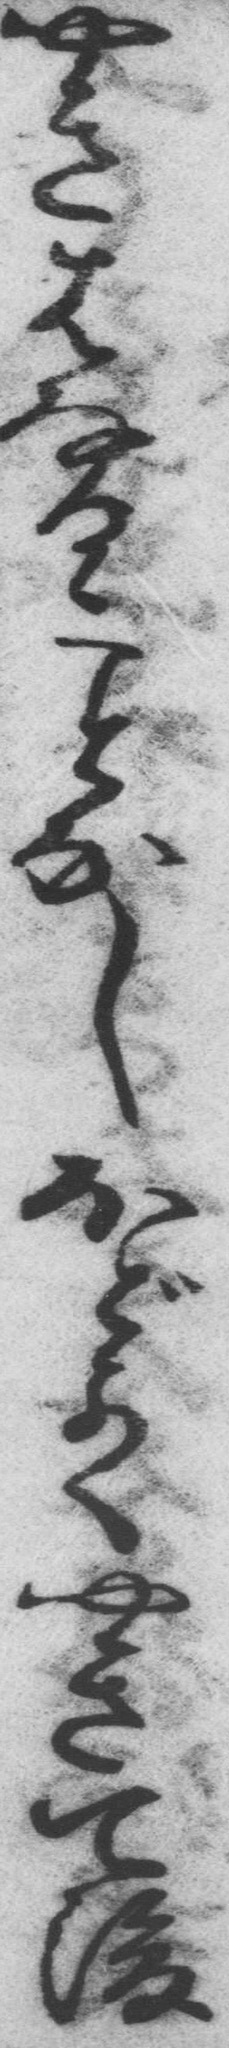やきはなるゝことなしほどよくやきて後
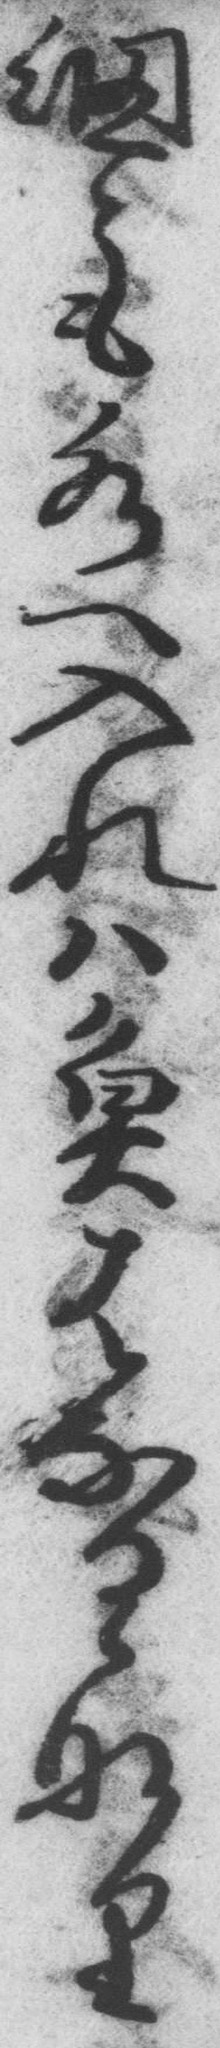網とも水へ入れは魚はなるゝなり
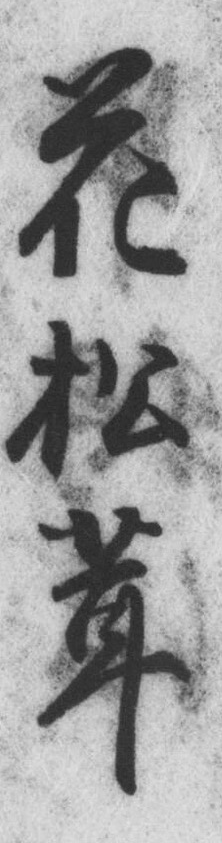花松茸
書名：料理山海郷
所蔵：大阪府立大学学術情報センター 国文学研究資料館
